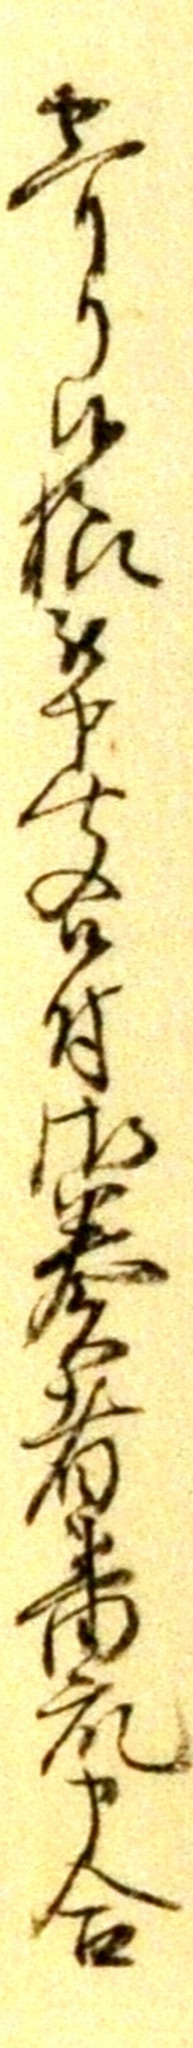寄り候様被申候付御奏者番衆申合

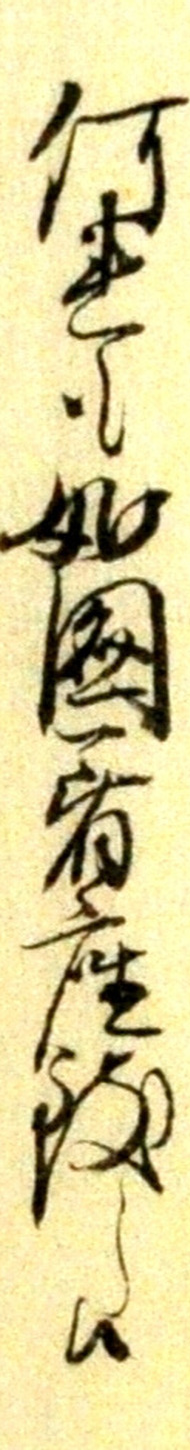何れモ如図着座致し候
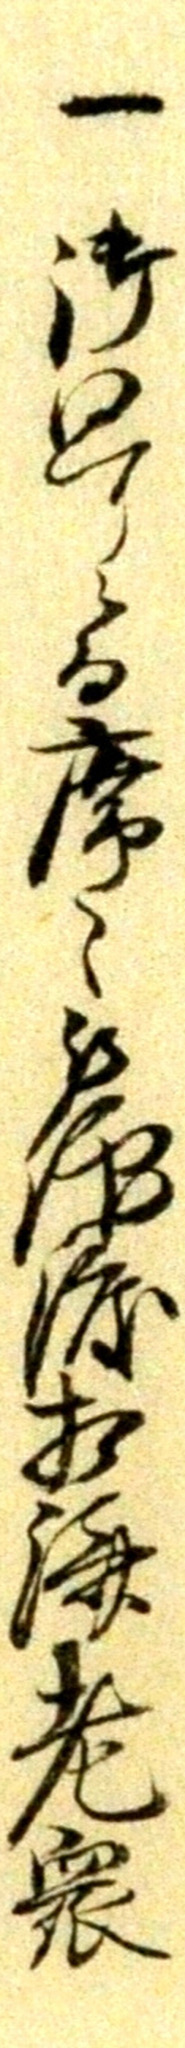一御廻りニ而席々被仰渡相済老衆
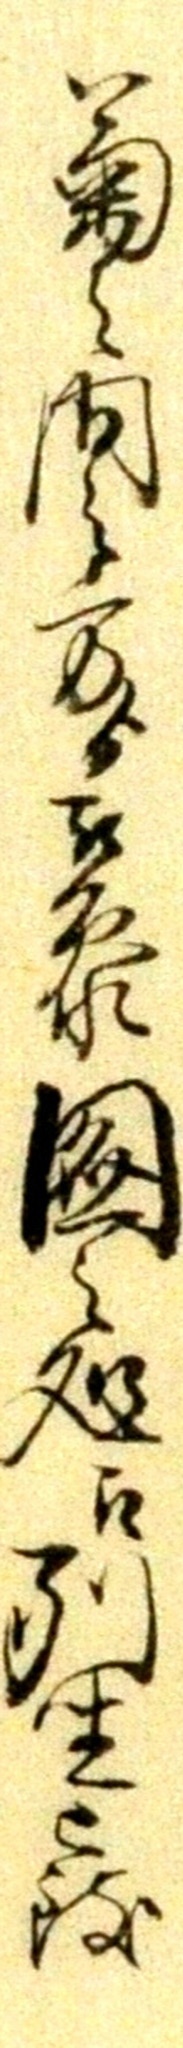菊之間之方ゟ被参図之処え列坐被致
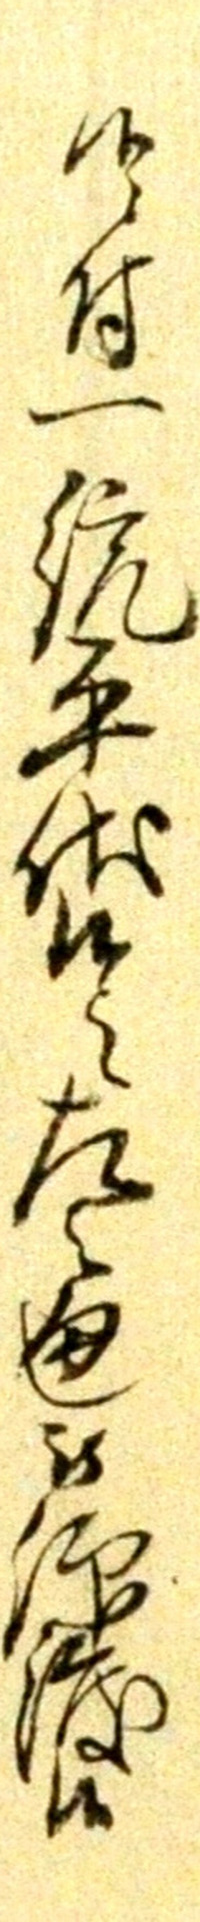候ニ付一統平伏候は左之通被仰渡候
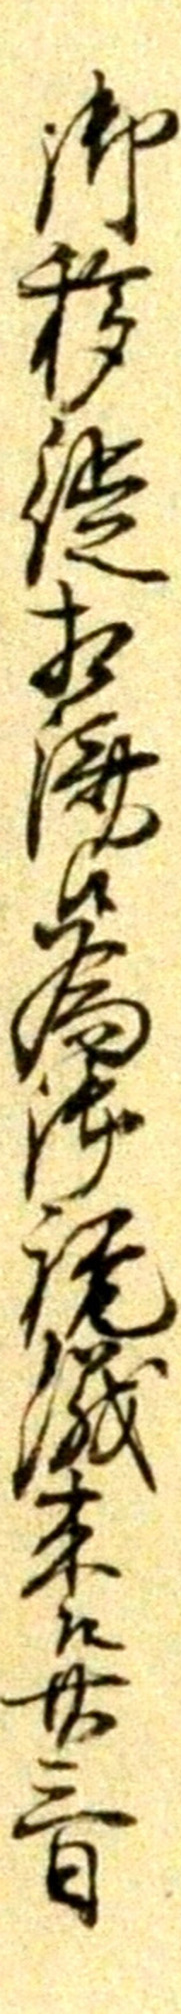御移徙相済候為御祝儀来ル廿三日
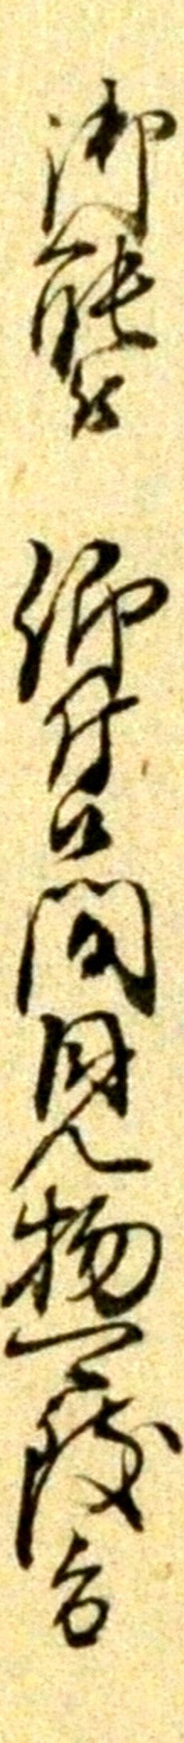御能被仰付候間見物可致旨
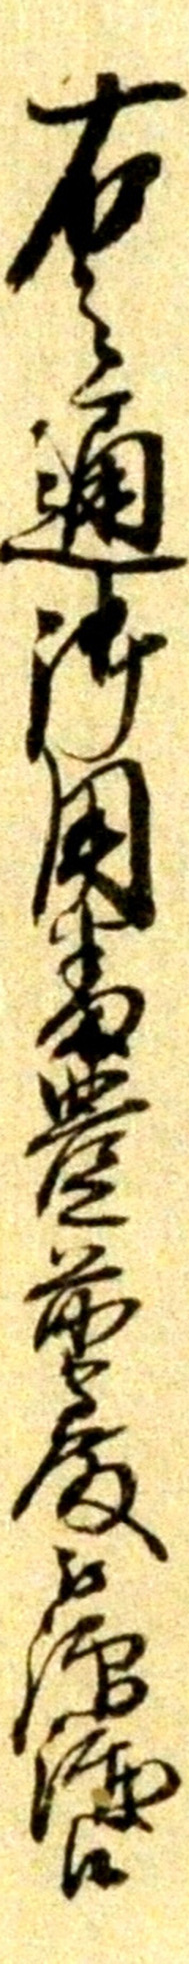右之通御用番豊前守殿被仰渡候
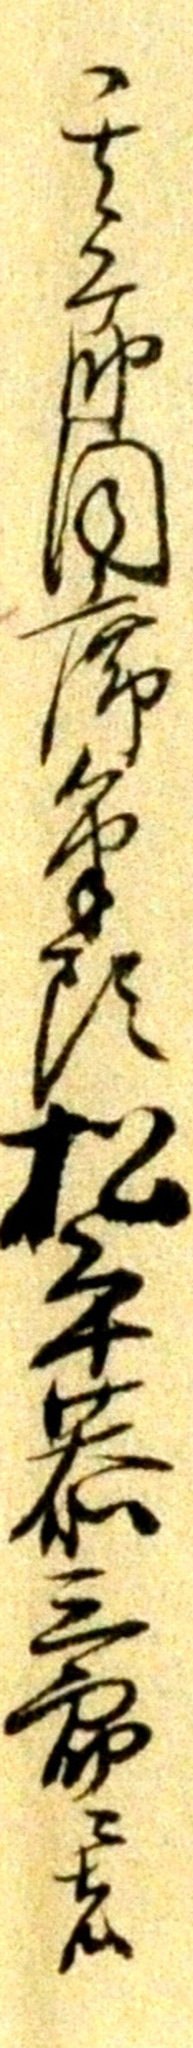其節同席筆頭松平恭三郎には
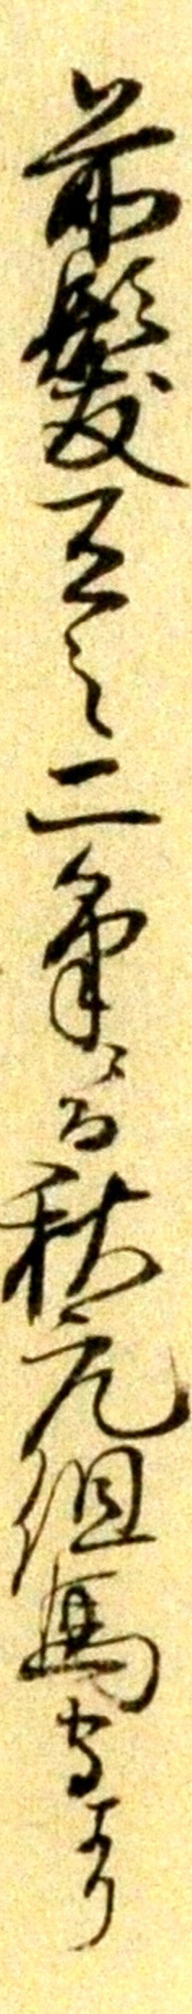前髪有之二筆ニ而秋元但馬守より
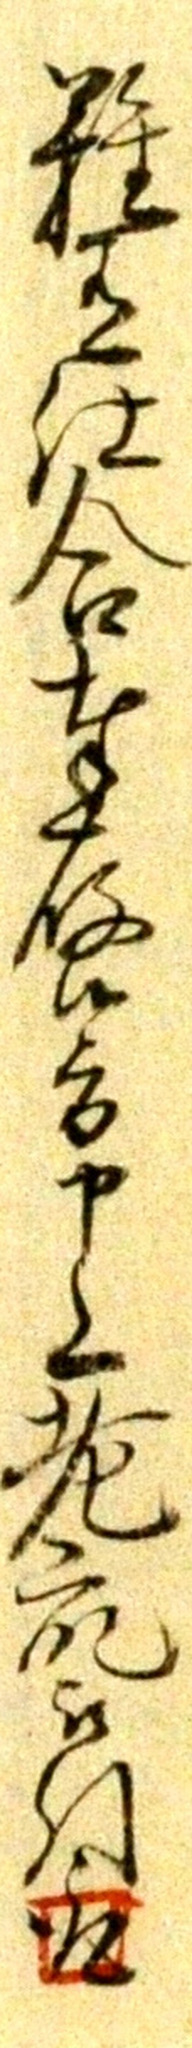難有仕合奉存候旨申上老衆被引取
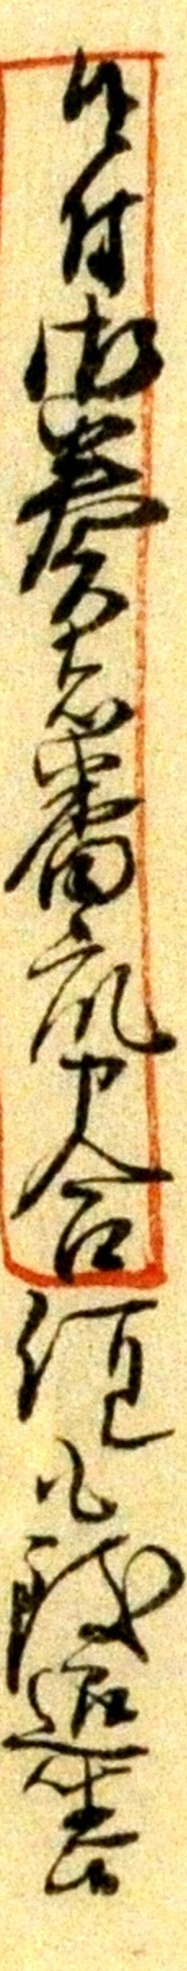候ニ付御奏者番衆申合何も致退坐候
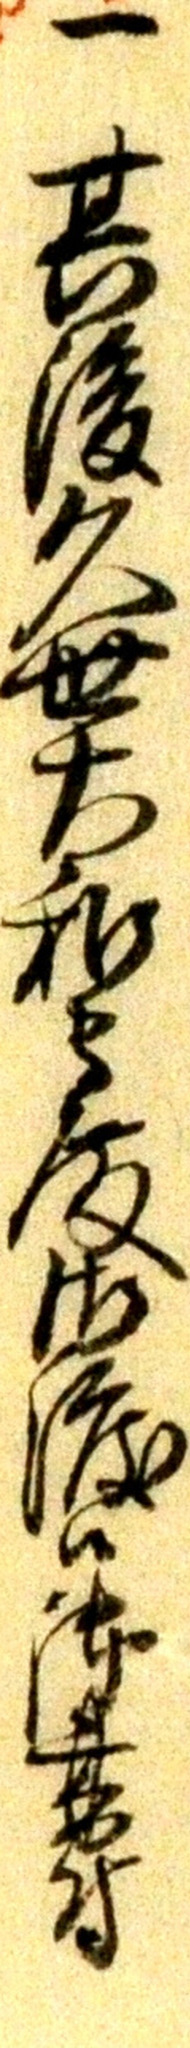久世大和守殿御渡候御書付写
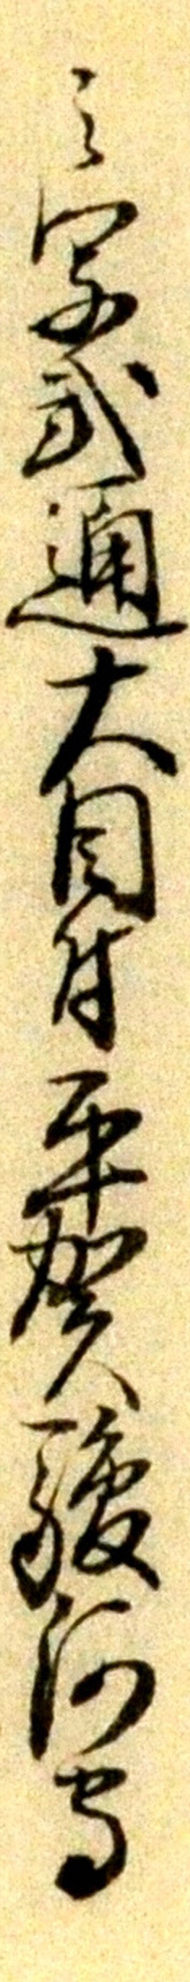之写弐通大目付平賀駿河守
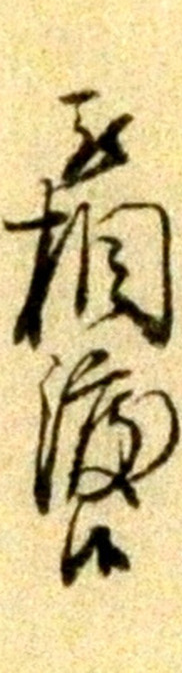被相渡候
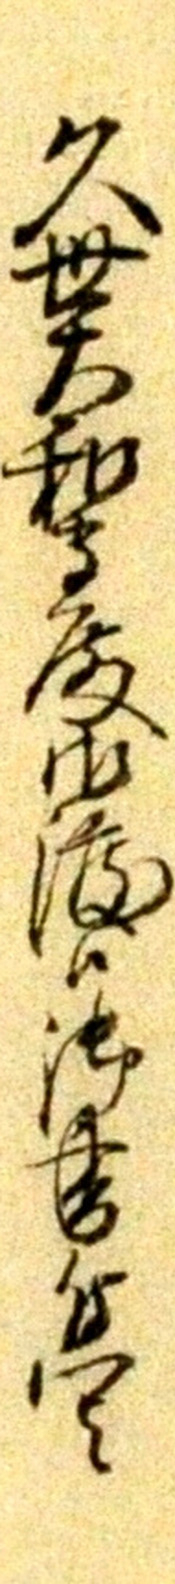久世大和守殿御渡候御書付写
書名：御移徒相済御祝儀御能ノ節ノ留外
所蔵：伊那市立高遠町図書館・合同会社AMANE
